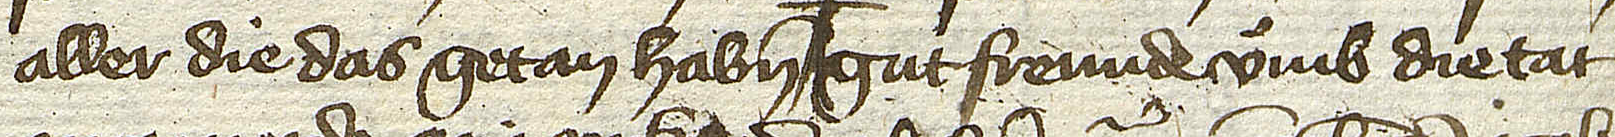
aller die das getan hab*n gut freunde v̈mb die tat
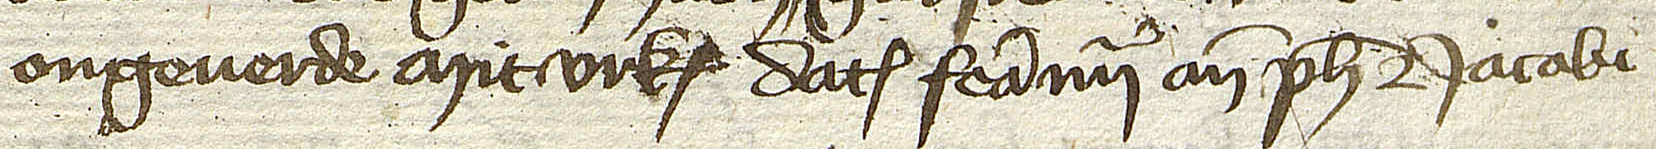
ongeuerde Mit vrk* dat* fea* iiii* an* ph* @ Iacobi
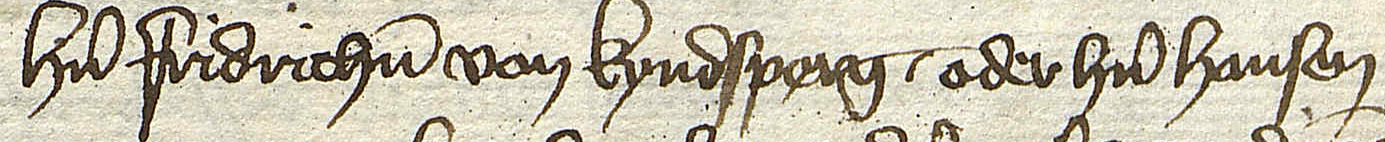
H*n Fridrich*n von Kyndſperg / oder h*n hanſen
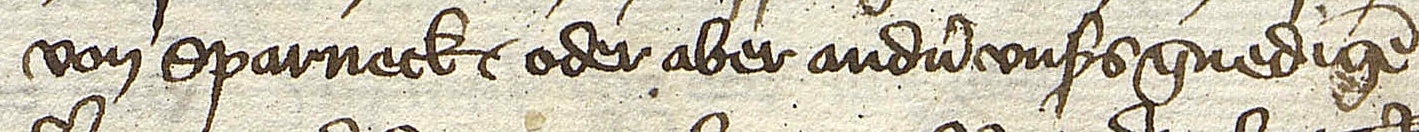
von Sparneck / oder aber and*n vnſ*s gnedige*
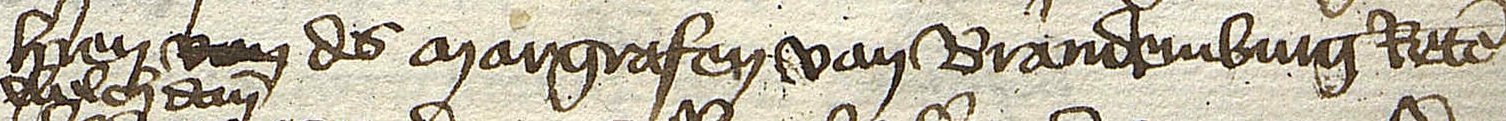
h*ren von des Margrafen von Brandemburg Rete*
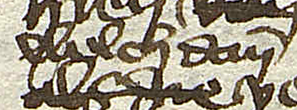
welch dan*
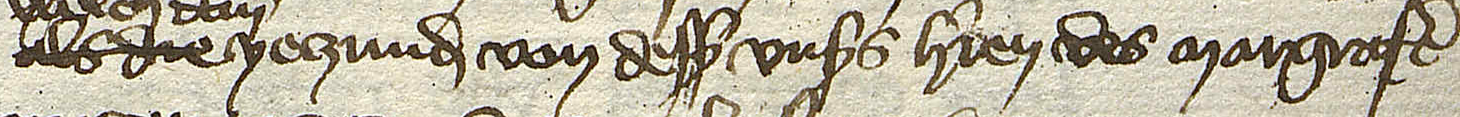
als die yecʒund* von deſſ* vnſ*s h*ren des Margrafe*
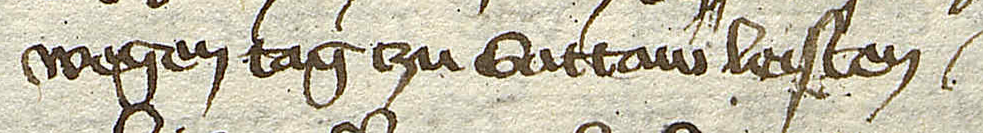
wegen tag cʒu Gattaw leiſten /
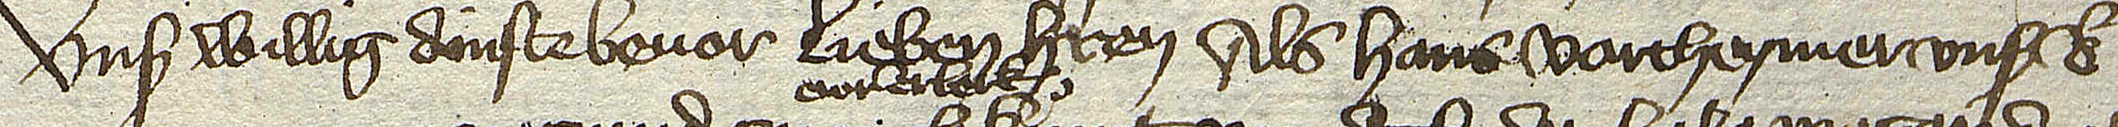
Vnſ*s willig dinſte beuor Lieben h*ren Als hans vorcheymer vnſ* B*
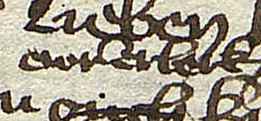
ewr* erberk*
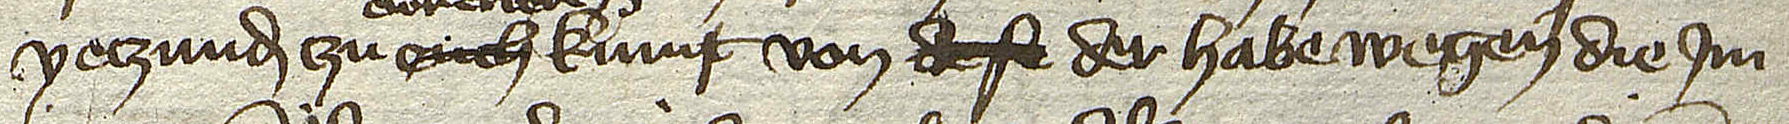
yecʒund* cʒu euch kümt von deſe der habe wegen die Im
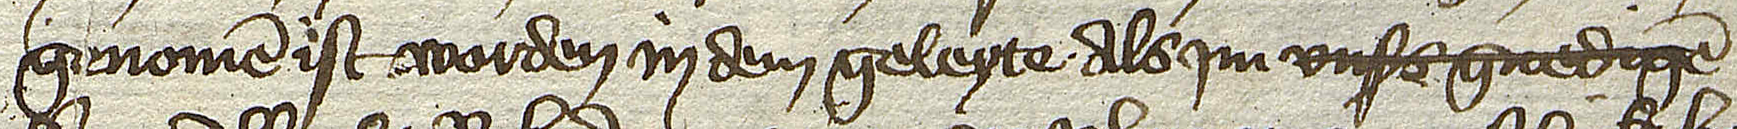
genome* iſt worden in dem geleyte . Als Im vnſ*s gnedige*
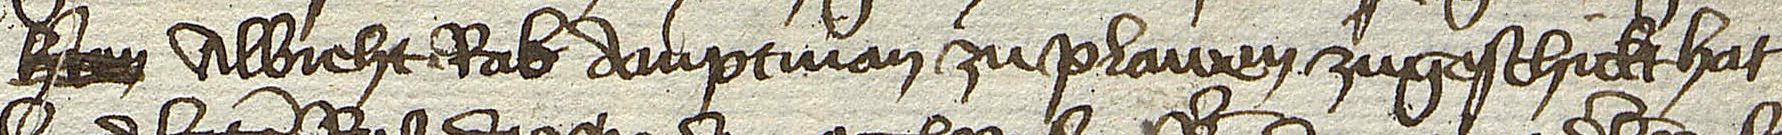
h*ren Albreht Rab Amptman ʒu plawen ʒugeſchickt hat
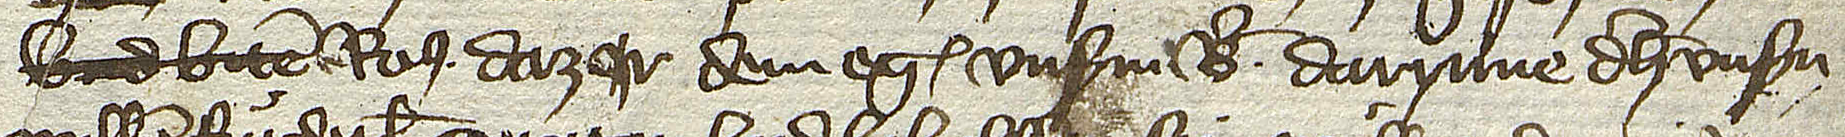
vnd bite* Ro* . daʒ Ir dem eg* vnſ*m B* . darynne d*h* vnſ*n
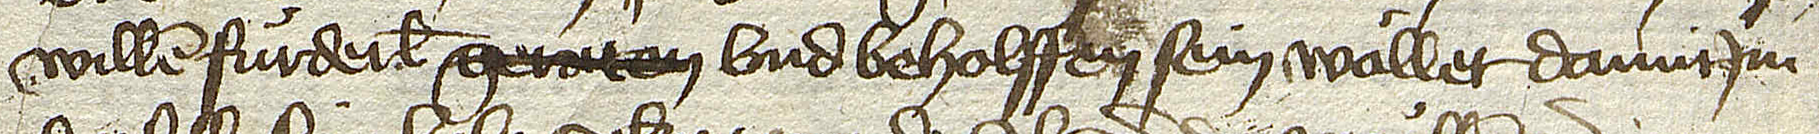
wille* fürderl* geraten vnd beholffen ſein wöllet damit Im
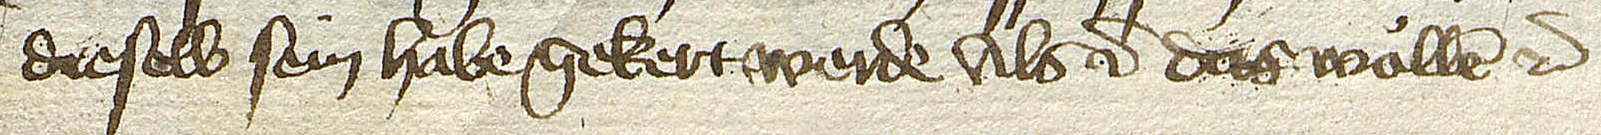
dieſelb ſein habe gekert werde Als ec* das wölle* ec*
